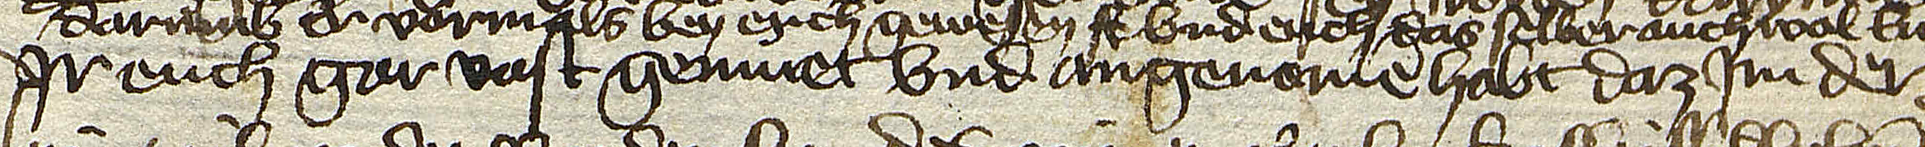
Ir euch gar vaſt gemüet vnd angenome* habt daʒ Im der
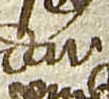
dar
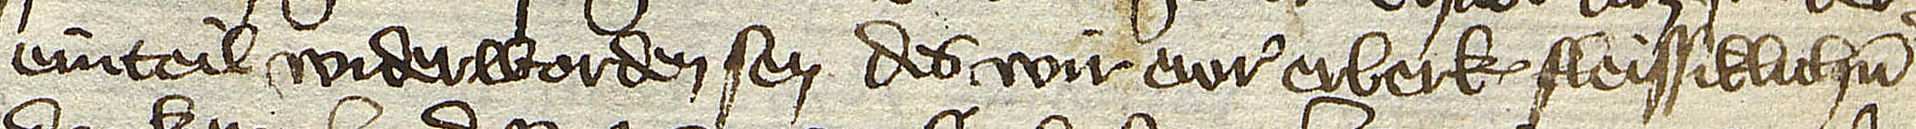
einteil widerworden ſey des wir ew*r erberk* ſleiſſiklich*n
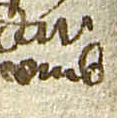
vmb
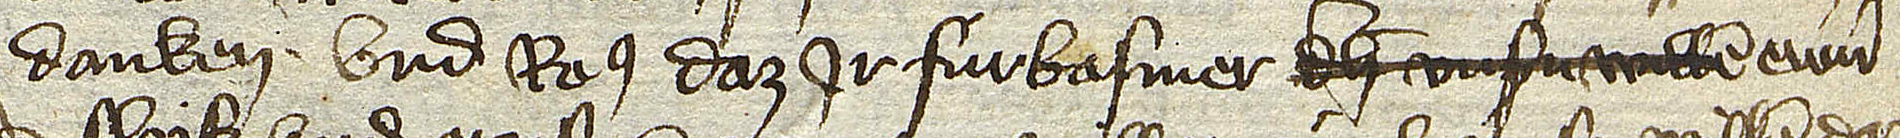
danken . vnd Ro* daʒ Ir fürbaſmer d*h vnſ*n wille* ew*n
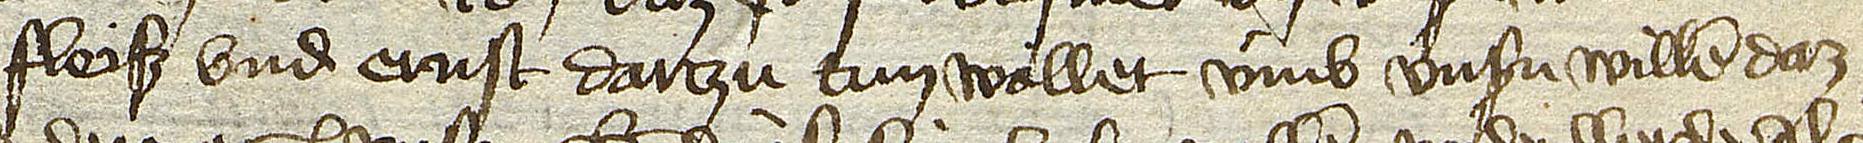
fleiſʒ vnd ernſt darcʒu tun wöllet v̈mb vnſ*n wille* daʒ
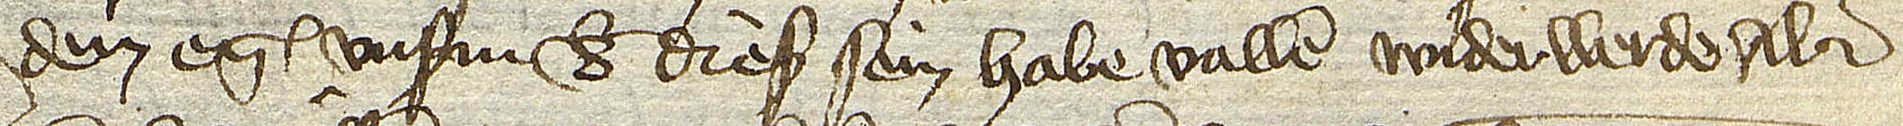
dem eg* vnſ*m B* dieſ* ſein habe volle* wider werde Al ec*
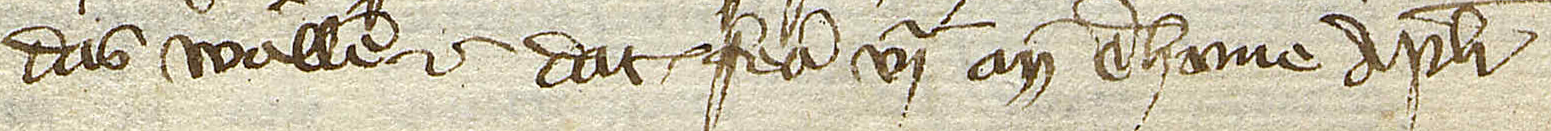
das wölle* ec* dat* fea* vi* an* Thome* Apli*
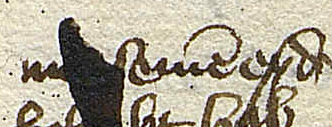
mit ſeine* eyd
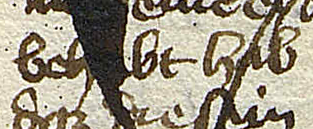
behabt hab
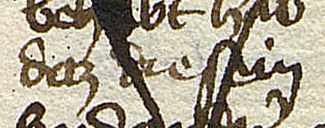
daʒ die ſein
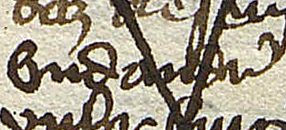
vnd and*r
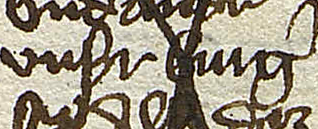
vnſ*r burg*
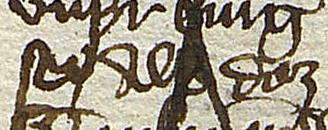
ſey Als daʒ
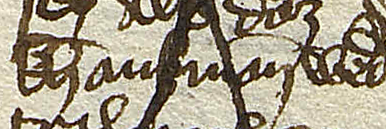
kh* auſʒman wed*
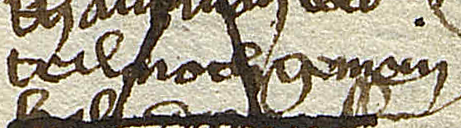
teil noch gemein
